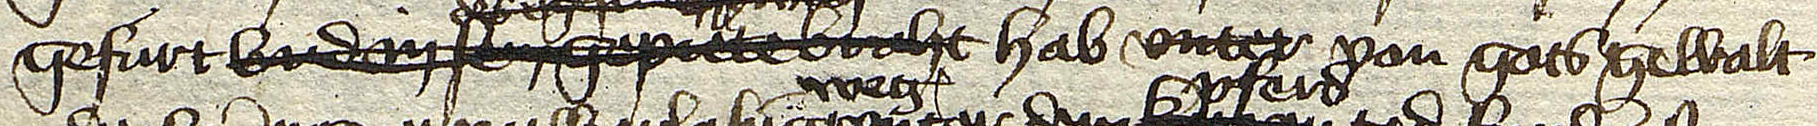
gefürt vnd in ſein gepiete braht hab vnter von gots gewalt
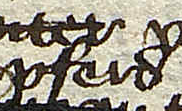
pferd
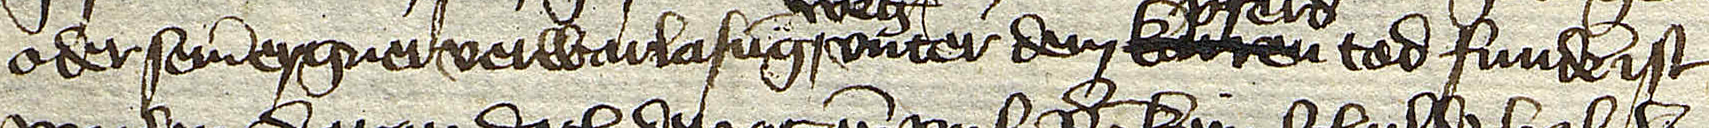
oder ſein* eygner verwarloſu*g vnter dem karren tod funde* iſt
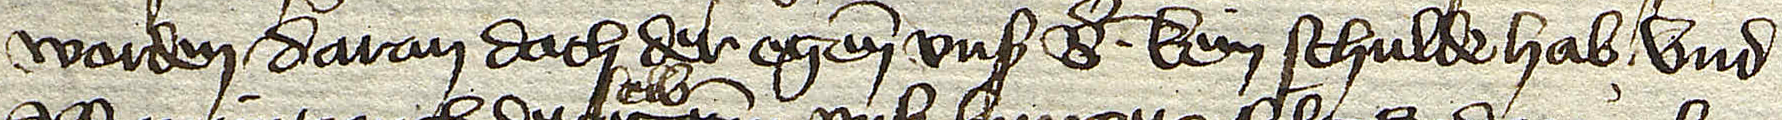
worden / daran doch der egen* vnſ* B* . kein ſchulde hab / Vnd
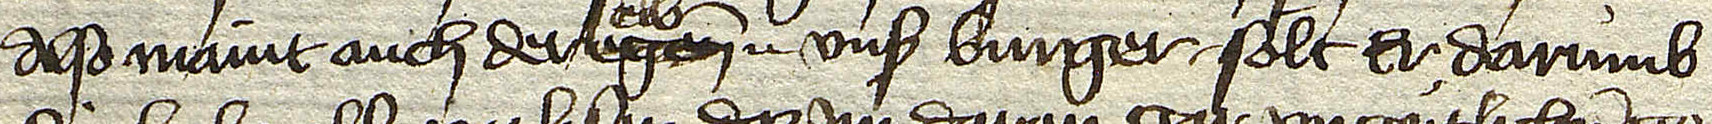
Alſo maint auch der egen* ~ vnſ* burger / ſölt Er darümb
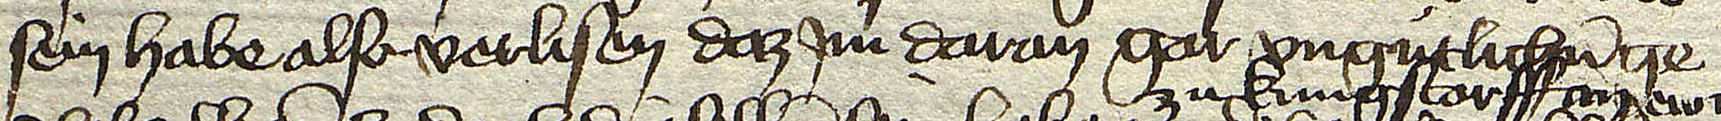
ſein habe alſo verliſen daʒ Im daran gar vngütlich*n ge
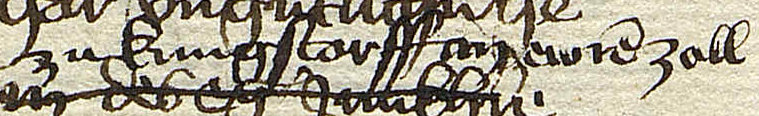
ʒu kungſtorfſſ an ewre* ʒoll
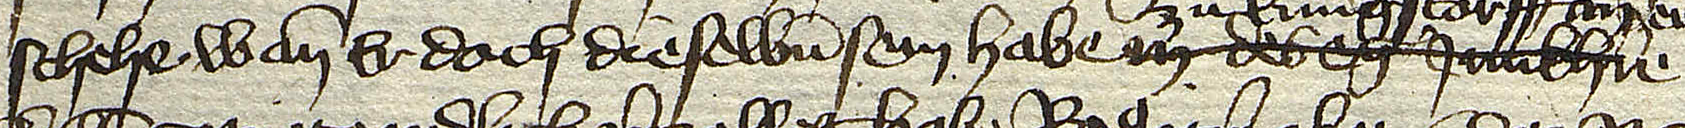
ſchehe . wan* Er doch dieſelb*n ſein habe in des eg* Iunkh*re
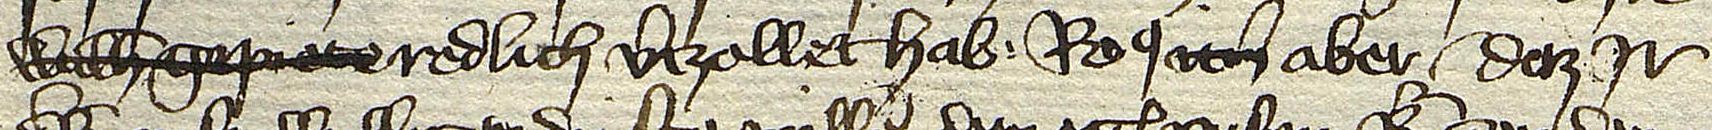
Wilh* gepiete redlich v*cʒollet hab . Ro* itm* aber / daʒ Ir
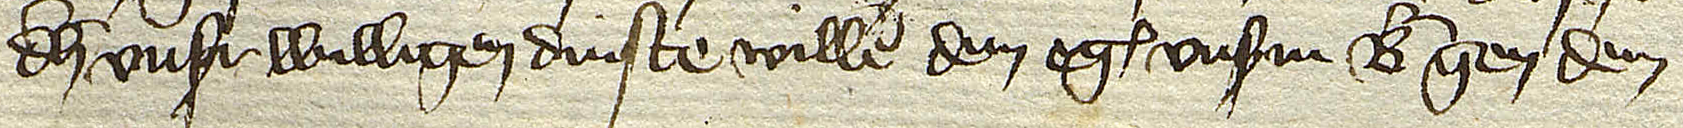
d*h* vnſ*r willigen dinſte wille* dem eg* vnſ*m B* gen dem
